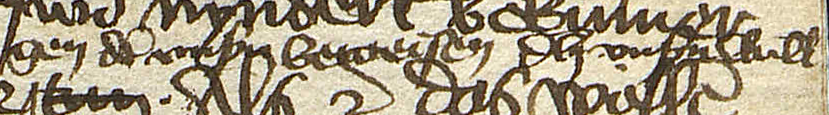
gen d* vnſ*n beweiſen d*h vnſ*n will*
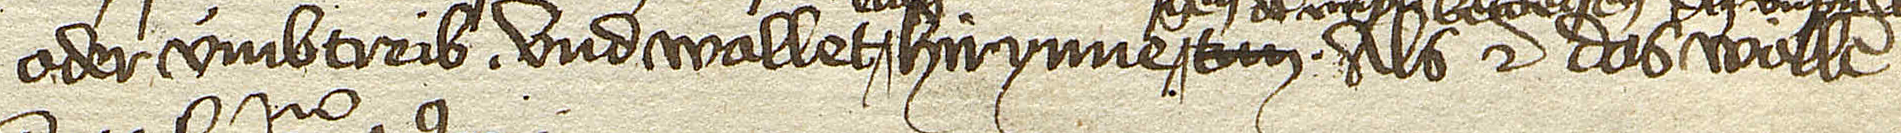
oder v̈mbtreib . vnd wöllet hirynne tun . Als ec* das wölle*
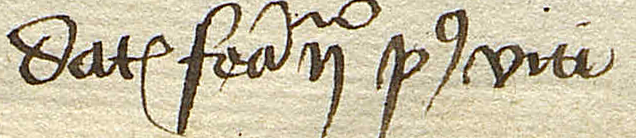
Dat* fea* ii* p* viti
